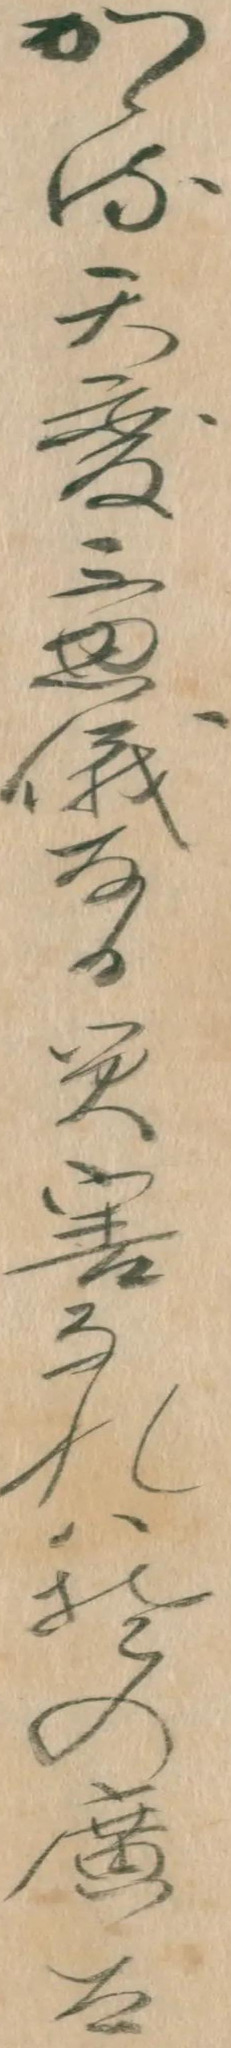かゝる天変不思儀なる災害なれはその広太
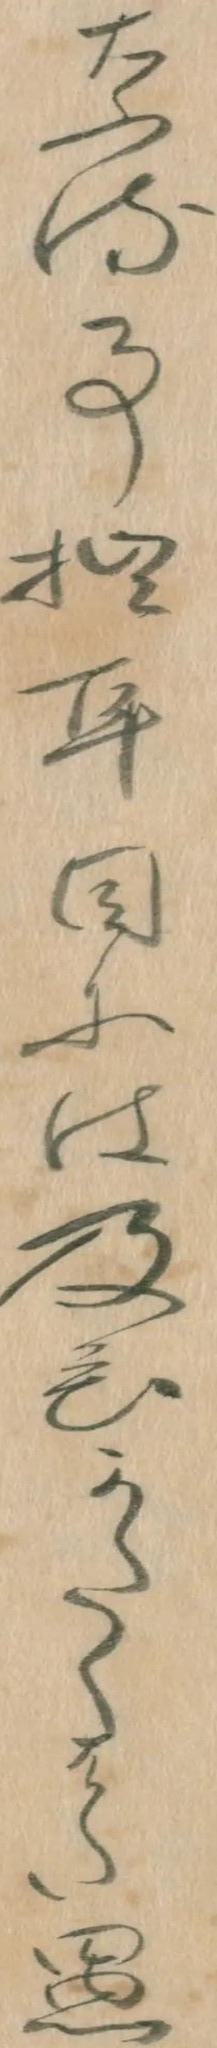なる事拙耳目には及ひかたくはた愚
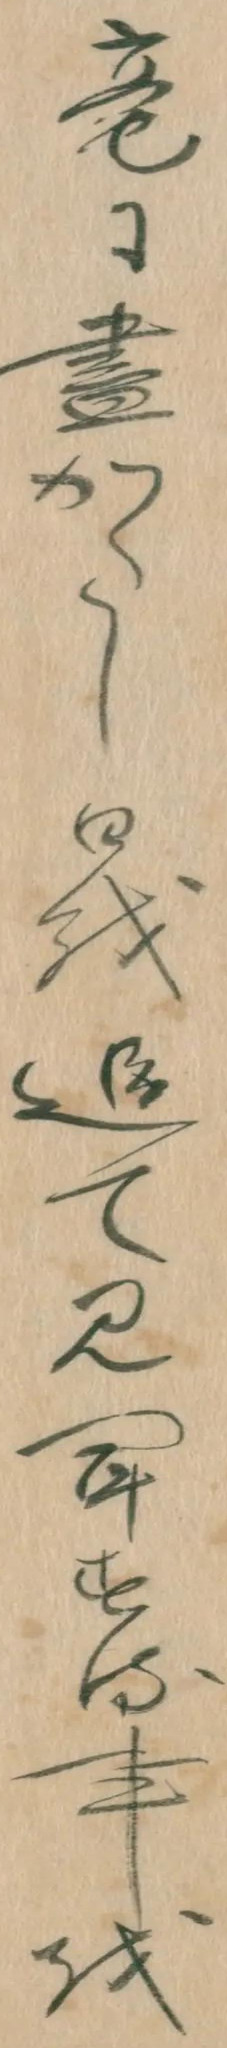毫に尽かたし日を追て見聞する事を
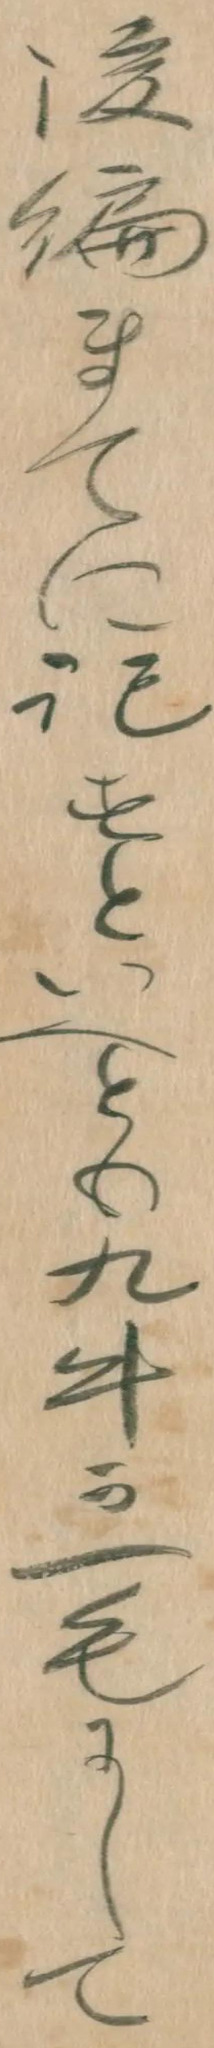後編まてに記すといへとも九牛か一毛にして
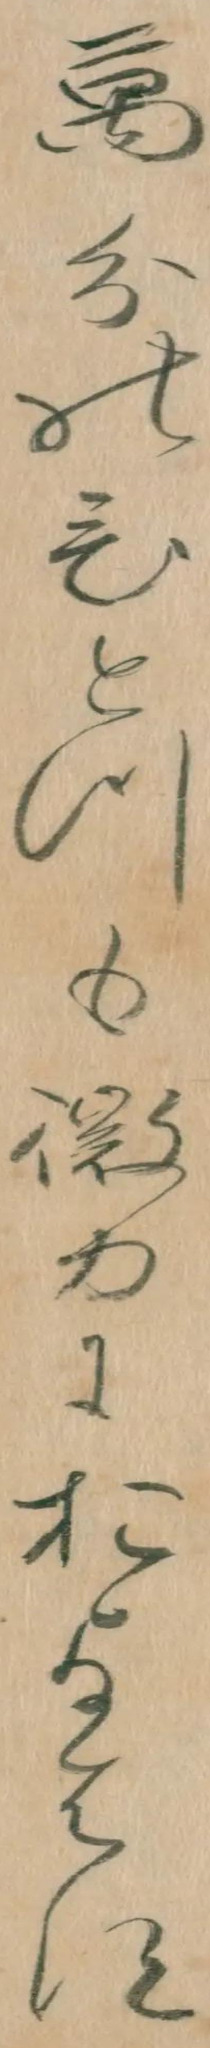万分のひとつも微力におよはす
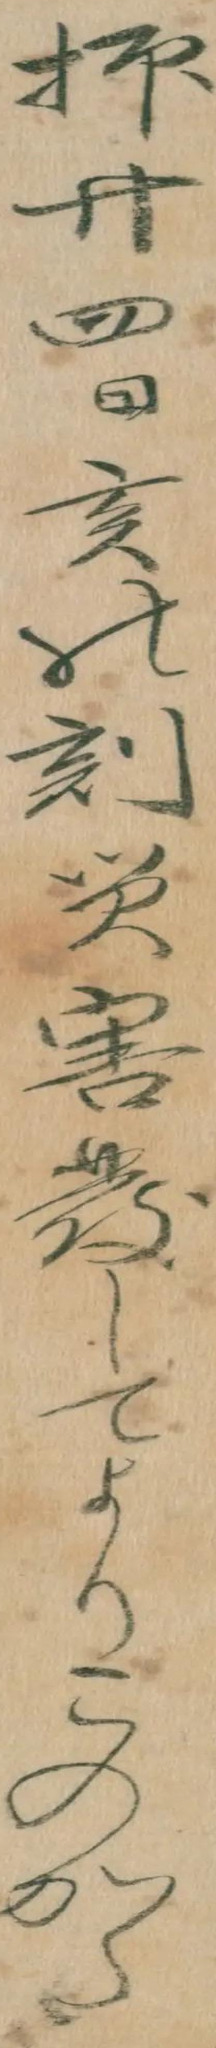抑廿四日亥の刻災害発してよりこのかた
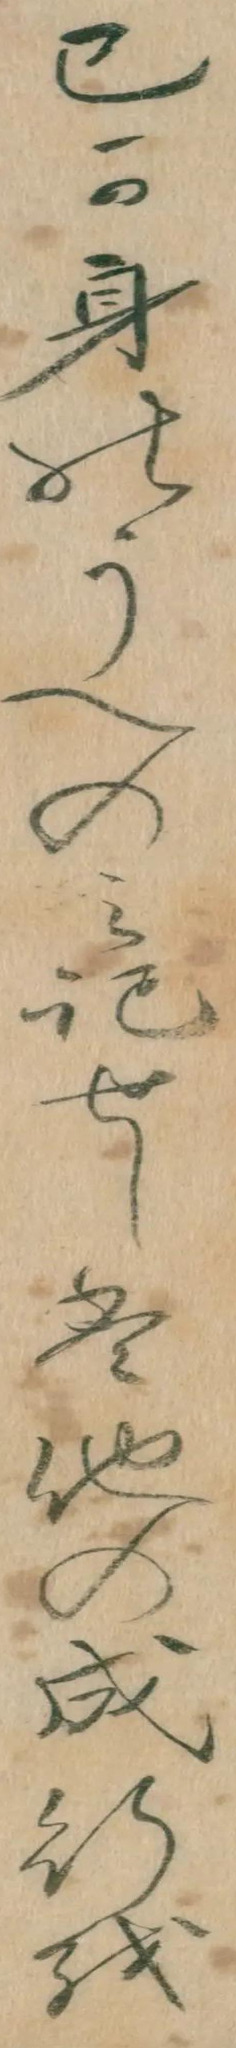己か身のうへのみ記せしは他の成行を
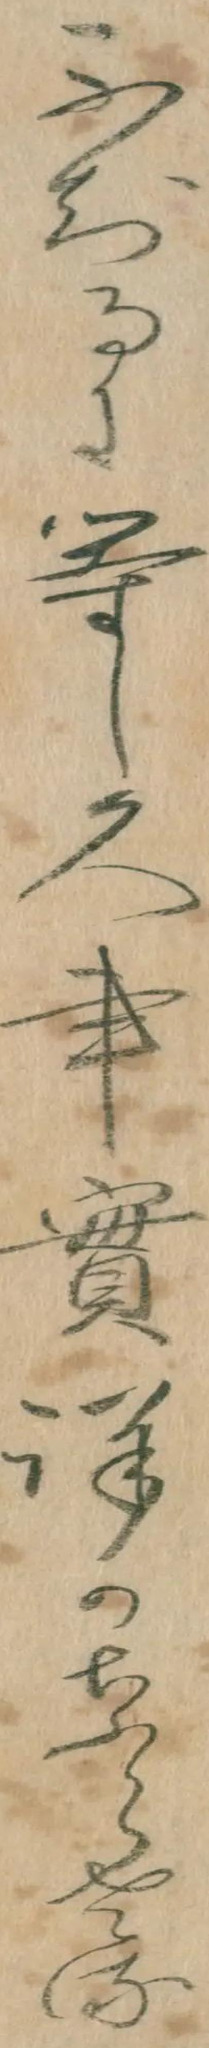不知るに等しく事実詳かならさる
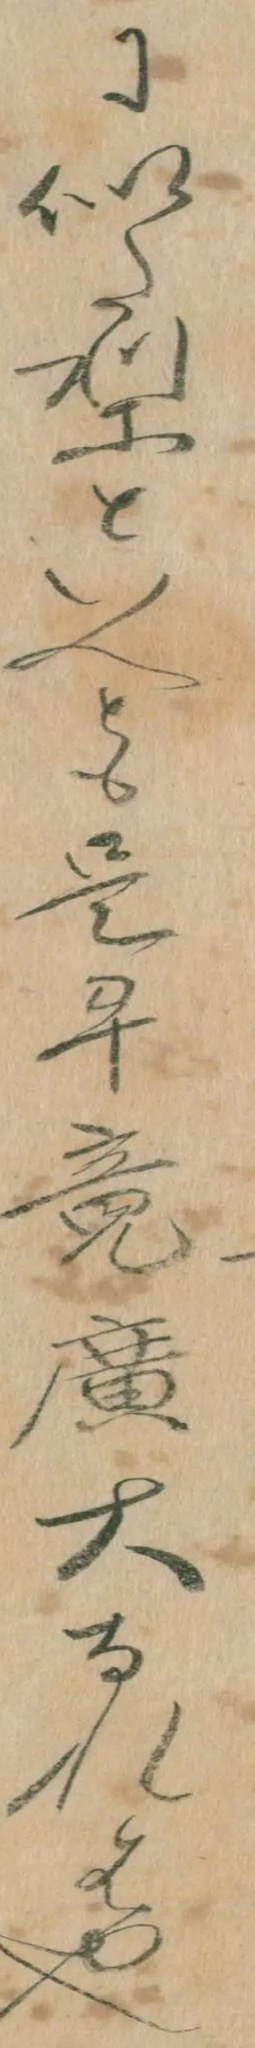に似たりといへとも是畢竟広大なれは也
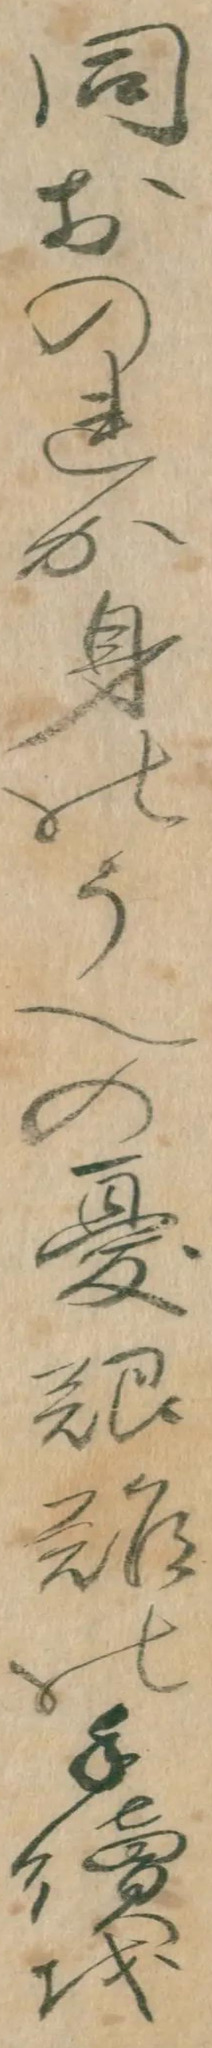同おのれか身のうへの憂艱難の手続を
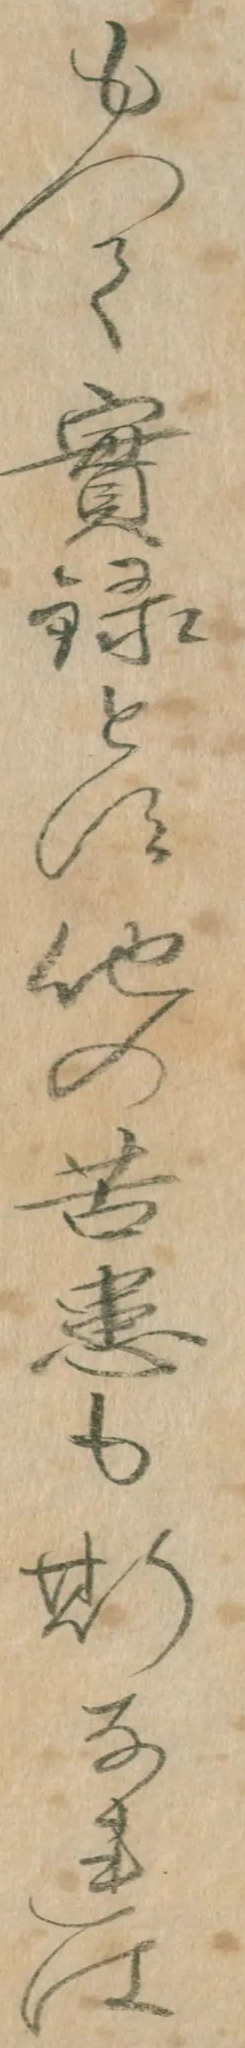もつて実録とす他の苦患も斯なれは
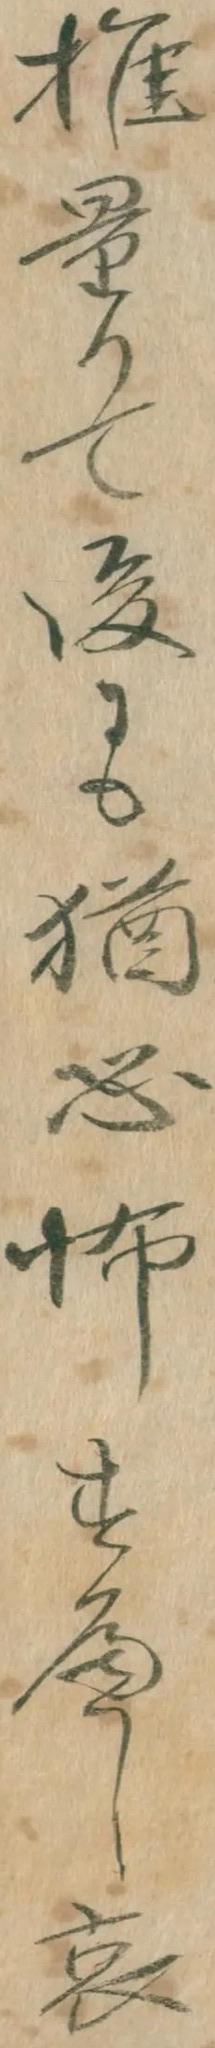推量りて後にも猶恐怖すへし哀
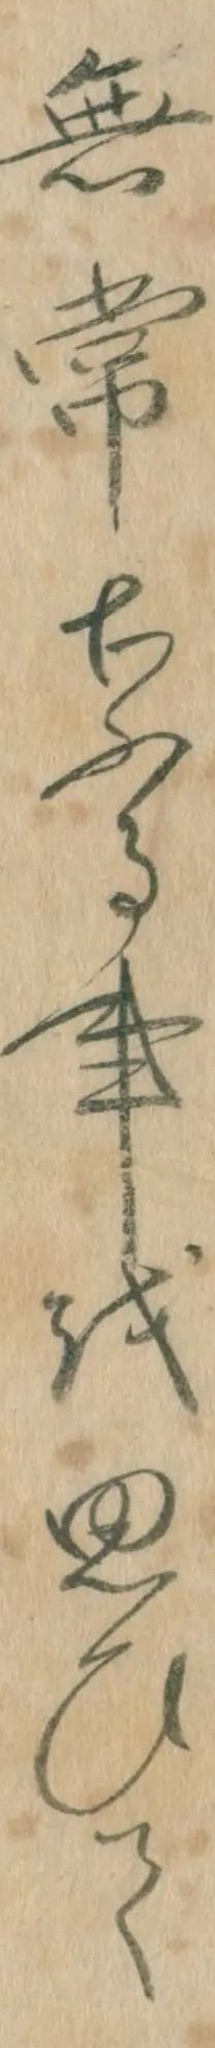無情なる事を思ひて
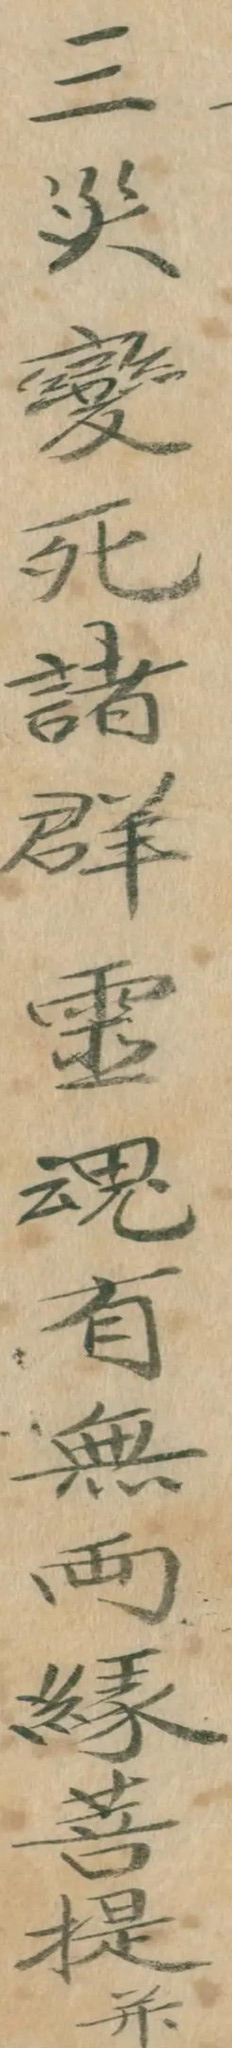三災変死諸群霊魂有無両縁菩提并
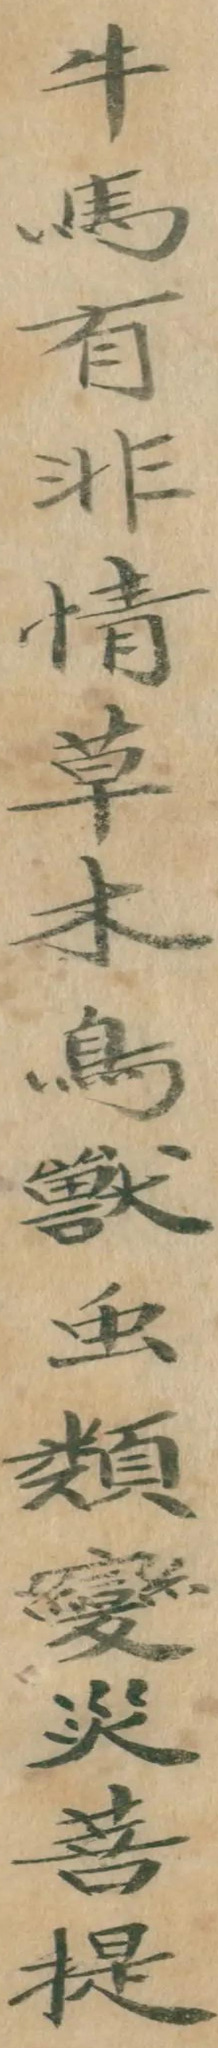牛馬有非常草木鳥獣虫類変災菩提

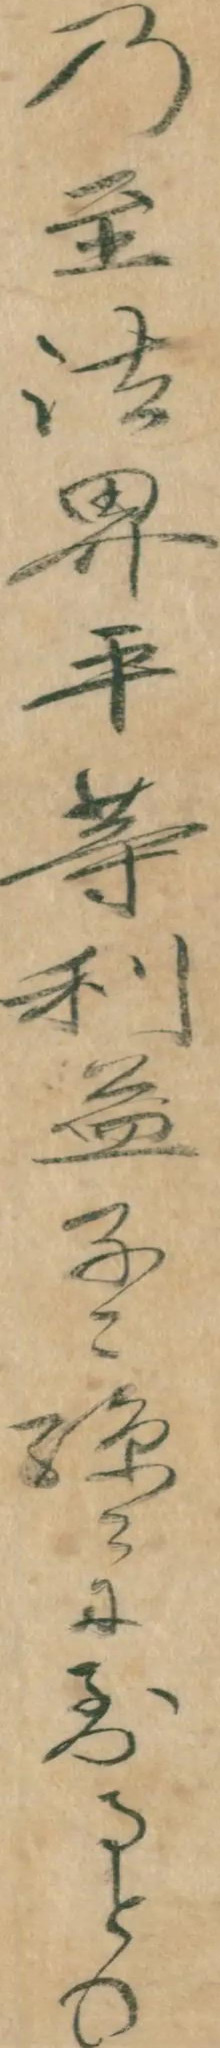の至法界平等利益子〻孫〻に到るとも
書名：俗語之種. [4]
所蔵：国立国会図書館 National Diet Library, JAPAN
